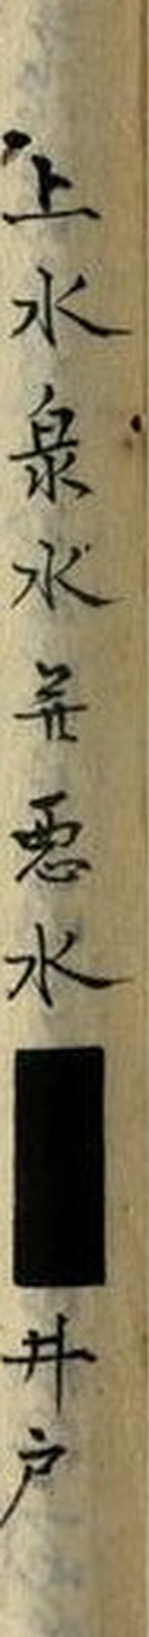上水泉水并悪水井戸
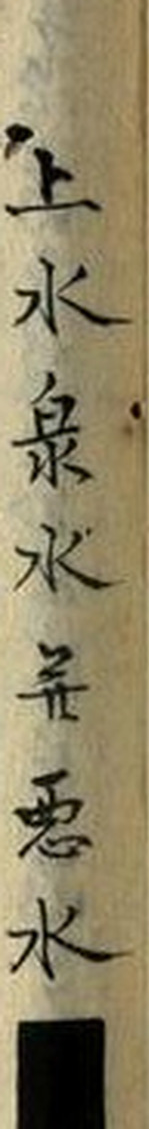上水泉水并悪水井戸
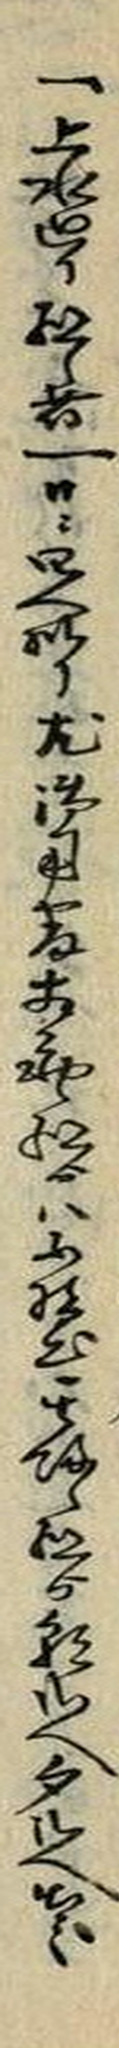一上水廻り組之者一日に四人掛り尤御用番相勤候組ゟは不指出其余之組ゟ朝弐人夕弐人出之
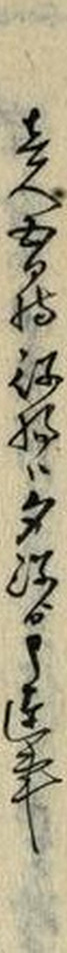壱人五日持役揚は夕役ゟ申達事
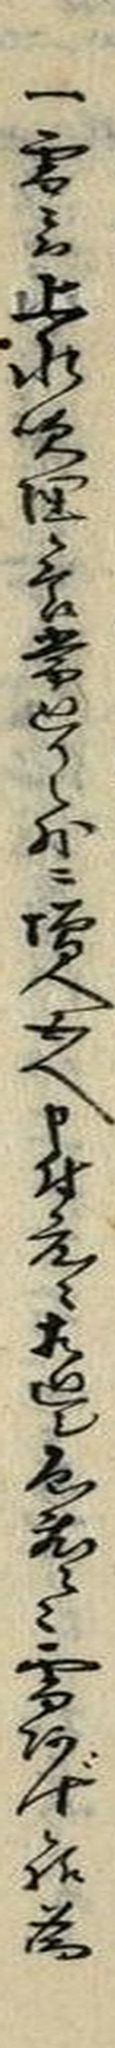一雪にて上水吹埋候節常廻り之外に増人五人申付元に相廻シ屋敷々々雪あげ候様為
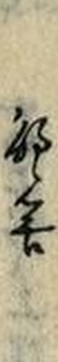触候筈
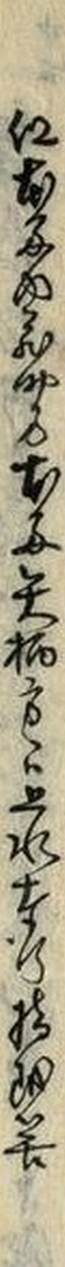但本多内蔵助方本多矢柄方へは上水奉行指越筈
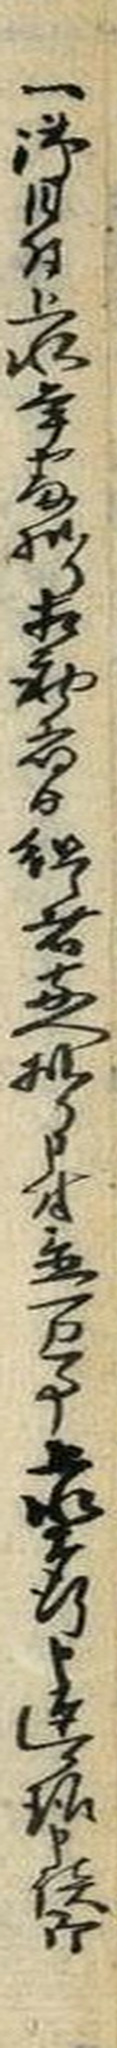一御目付上水年番掛り相勤者ゟ組之者両人掛り申付置万事上水奉行申達候趣申談御
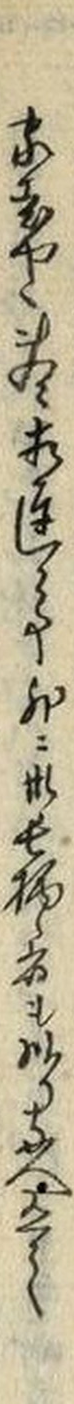家老中へ夫々相達候事外に御長柄之者も掛り両人有之
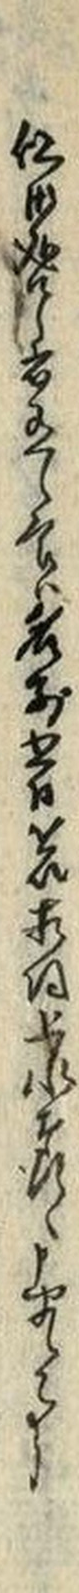但御咎之者有之節は名前書付を以相伺上水奉行へ申聞候事
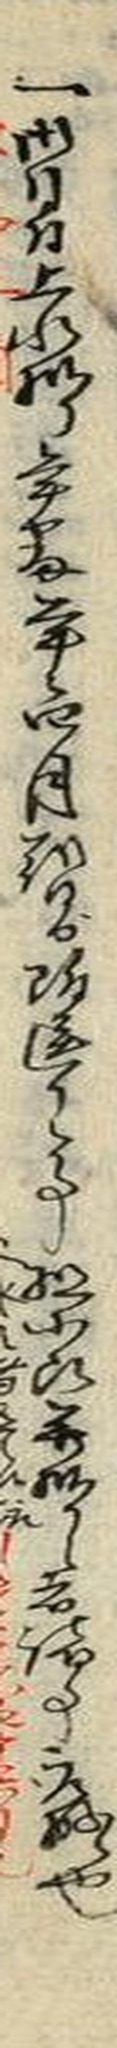一御目付上水掛り年番年々四月朔日ゟ附送り候事但小頭并掛り之者諸事取扱候也
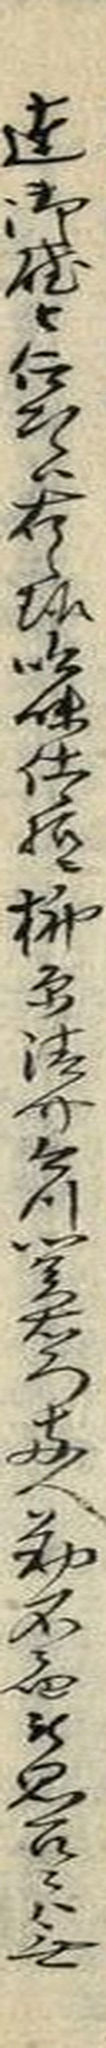達御聴被仰出候は右之趣吟味仕候様に榊原清介今川関右衛門両人勤不届被思召には無
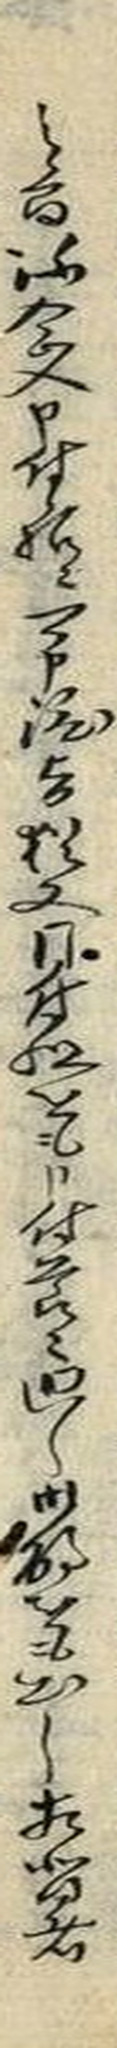之候間弥念入申付候様に可申渡旨猶又目付組をも申付節々廻し御触をも出し相背者
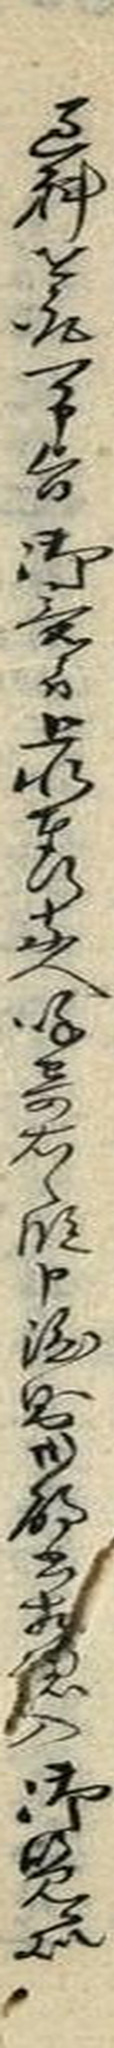過料を取可申旨御意に付上水奉行両人呼寄右之段申渡則御触書相認入御覧候処
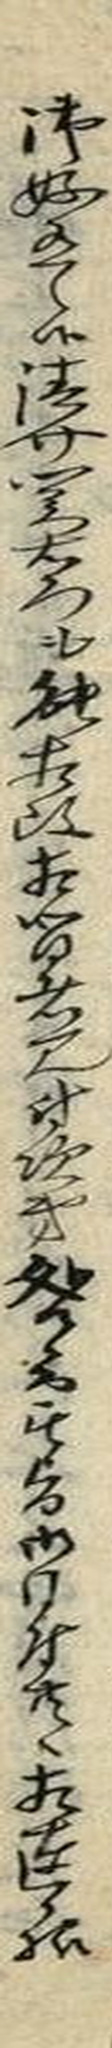御好有之候清介関右衛門も能相改相背者見付次第咎候て其旨御目付共へ相達候様
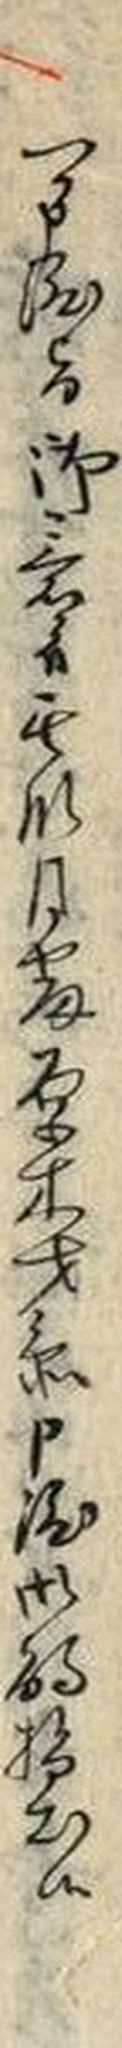可申渡旨御意に付其段月番厚木才兵衛申渡御触指出候
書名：御城下諸事之部
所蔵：福井県文書館 Fukui Prefectural Archives
